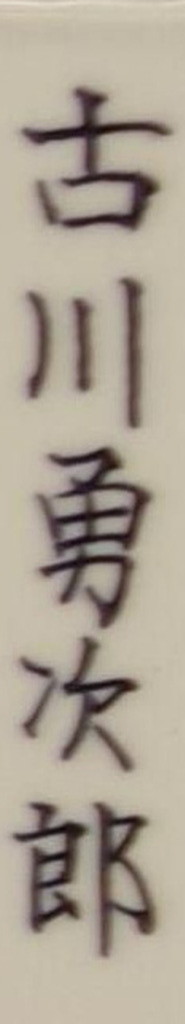古川勇次郎
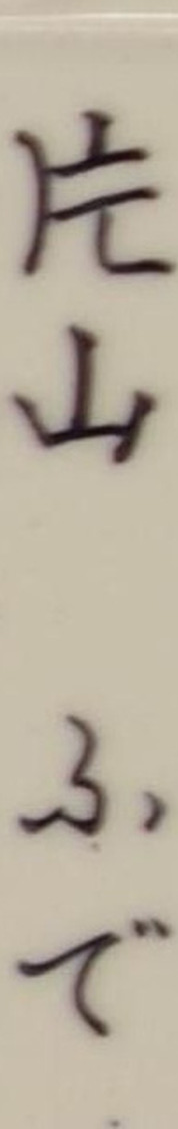片山ふで
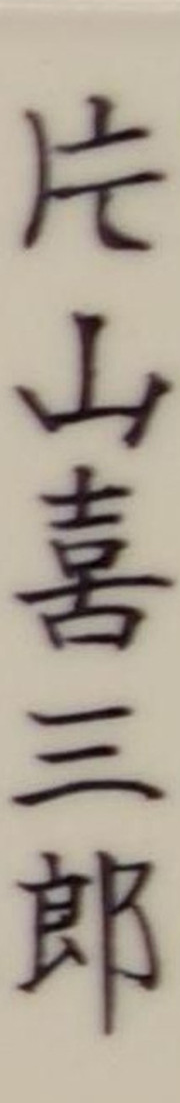片山喜三郎
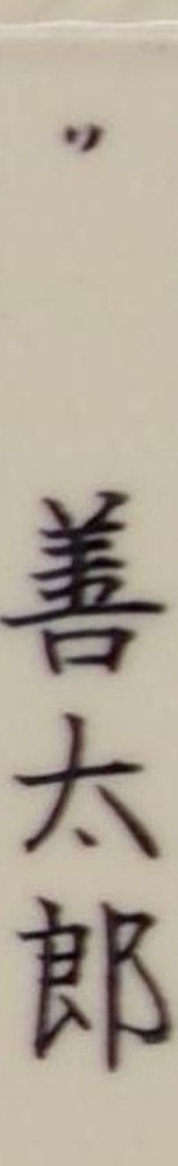善太郎
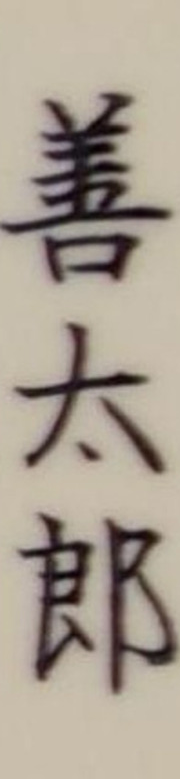善太郎
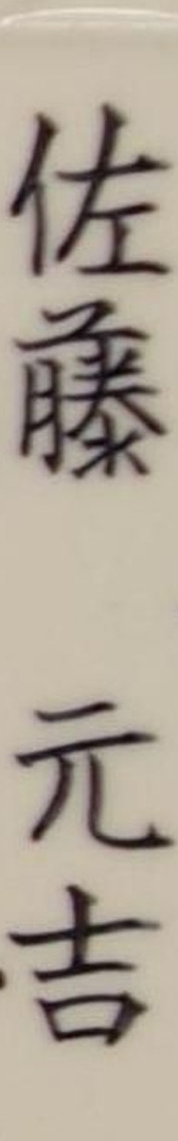佐藤元吉
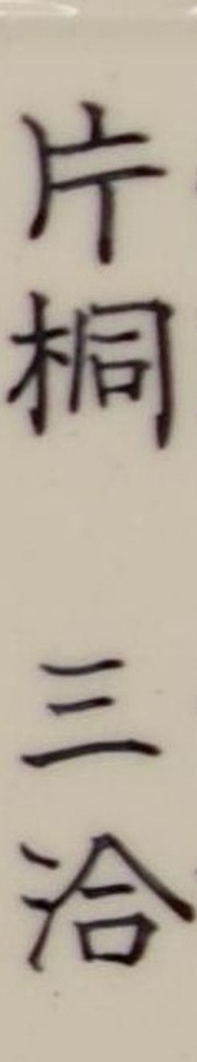片桐三洽
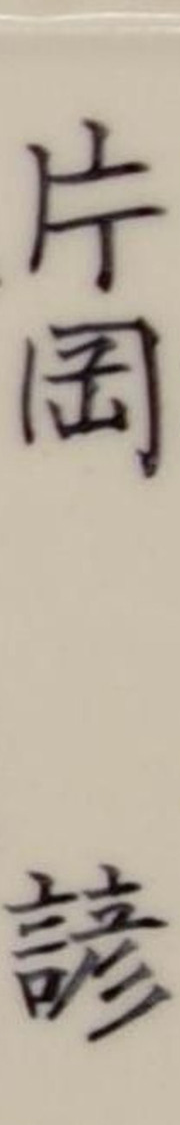片岡諺
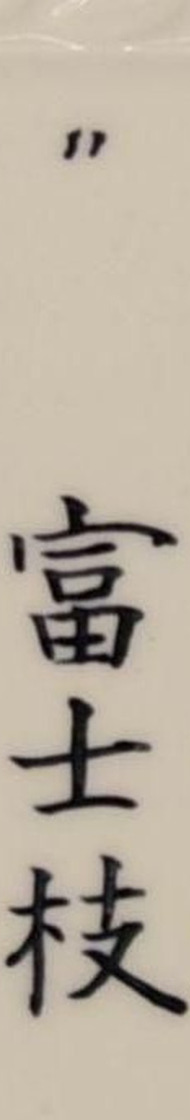富士枝
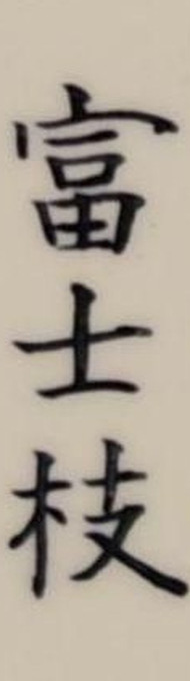富士枝
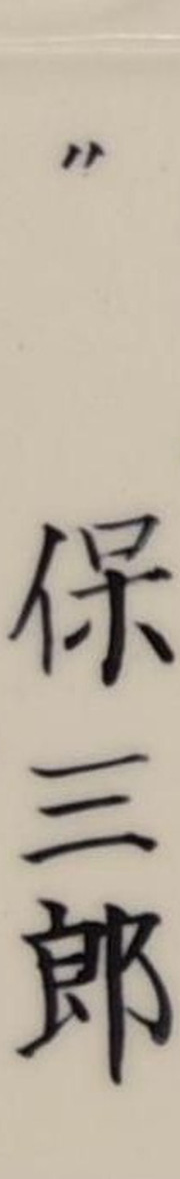保三郎
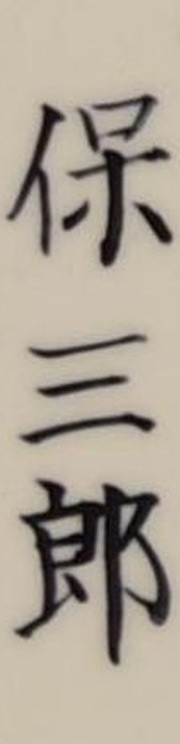保三郎

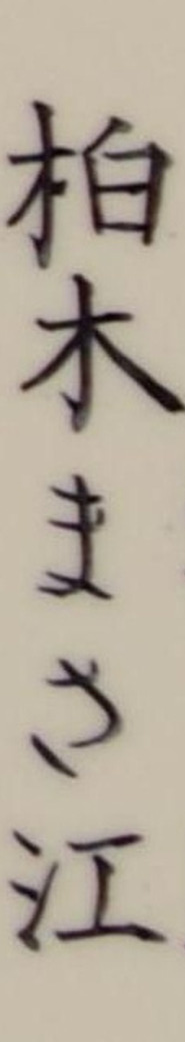柏木まさ江
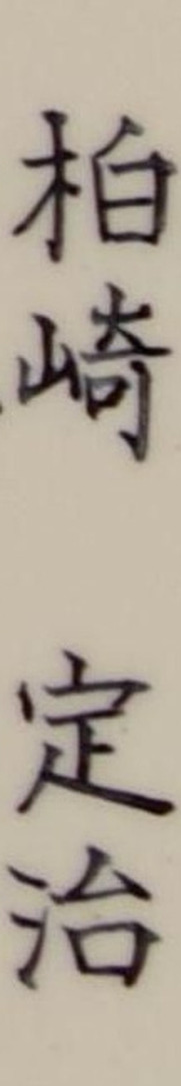柏崎定治
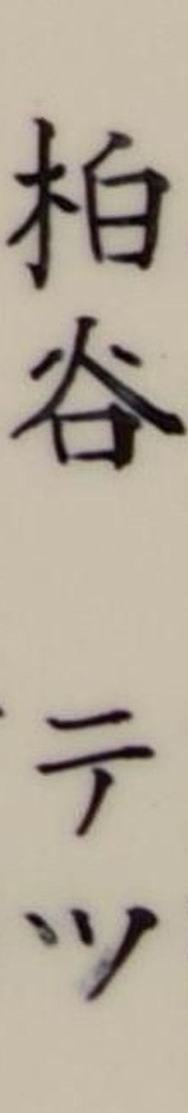柏谷テツ
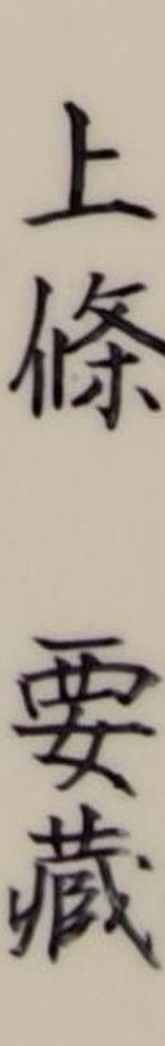上條要蔵
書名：E~L
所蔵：高野山金剛峯寺
